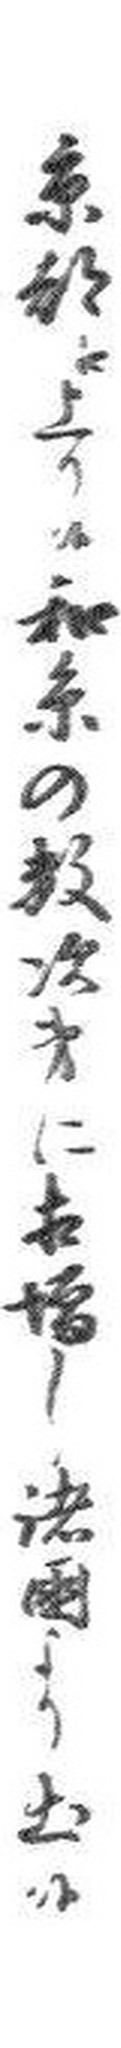京都江上り候和糸の数次第に相増し諸国より出候
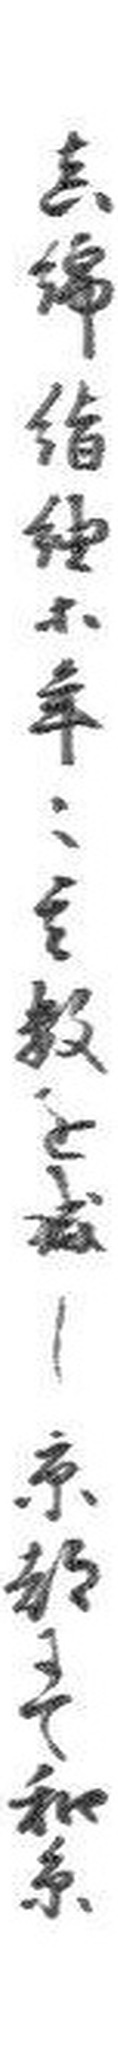真綿絹紬等年々其数を減し京都にて和糸

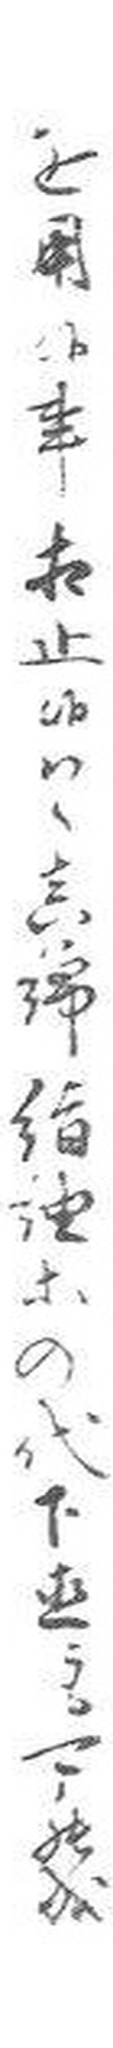を用候事相止候ハヽ真綿絹紬等の代下直も可罷成
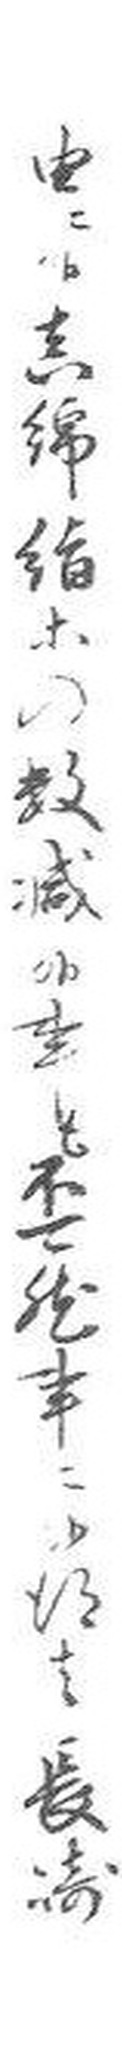由ニ候真綿絹等の数減候事も不可然ニ候得者長崎
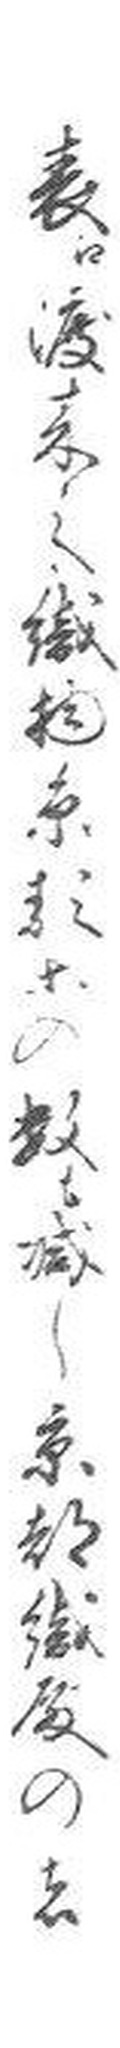表江渡来之織物糸類等の数も減し京都織殿の者
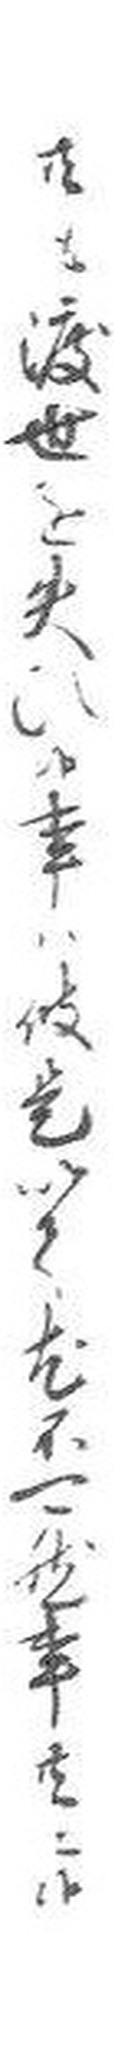共も渡世を失ひ候事ハ彼是以て尤不可然事共ニ候
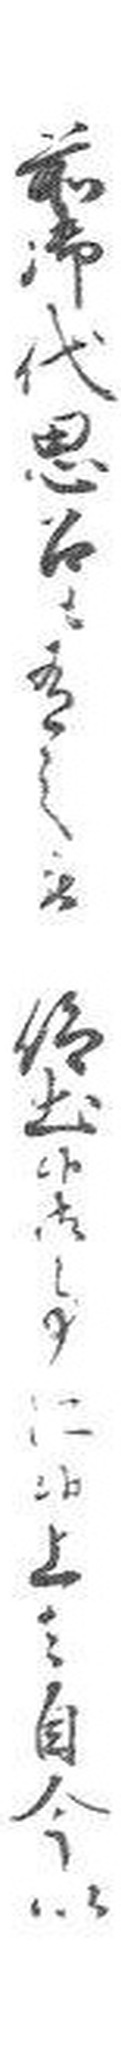前御代思召も有之被仰出候御事に候上者自今以
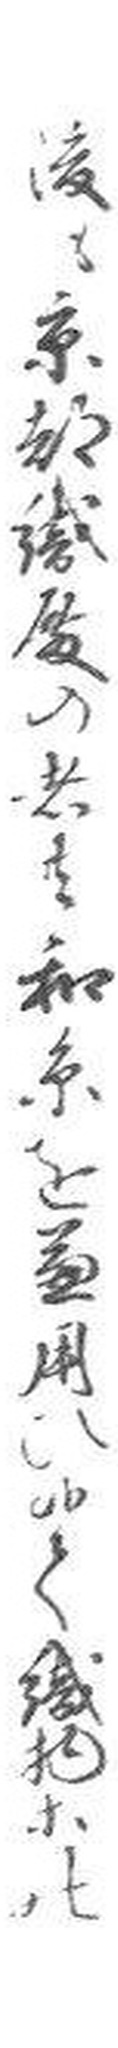後も京都織殿の者共和糸を兼用ひ候て織物等の
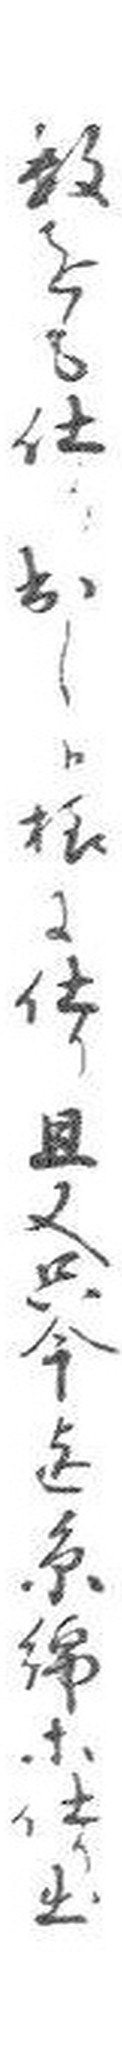数をも仕り出し候様に仕り且又只今迄糸綿等仕り出
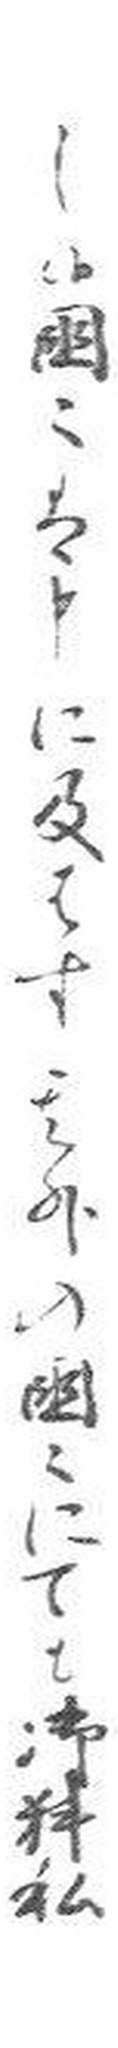し候国々は申に及はす其外の国々にても御料私
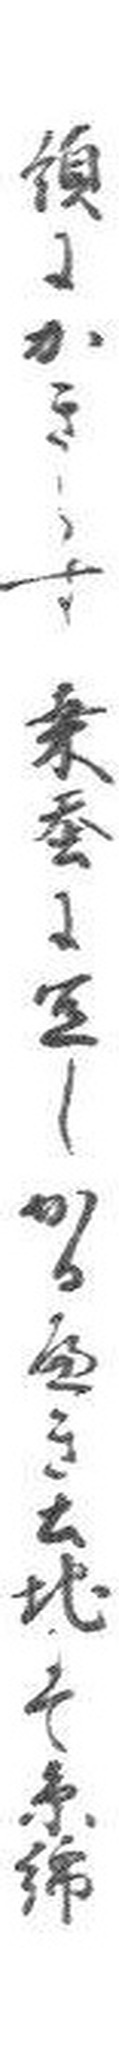領にかきらす桑蚕に宜しかるへき土地にて糸綿
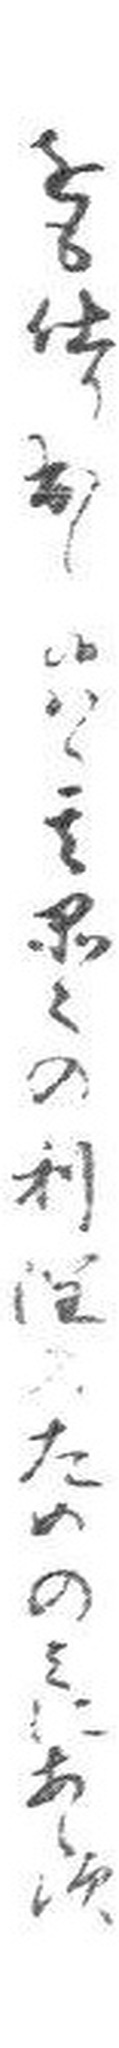をも仕り出し候ハヽ其品々の利潤のためのミにあらす
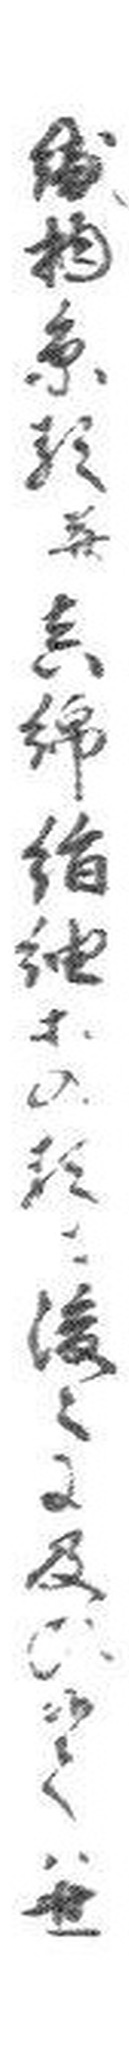織物糸類并真綿絹紬等の類ニ後々に及ひ候てハ世
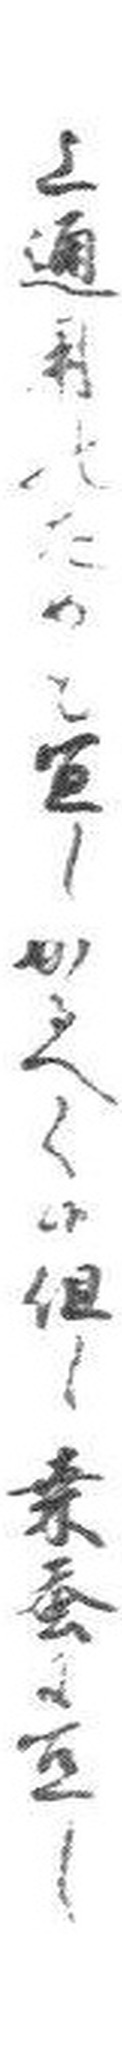上通用のためと宜しかるへく候但し桑蚕に宜し
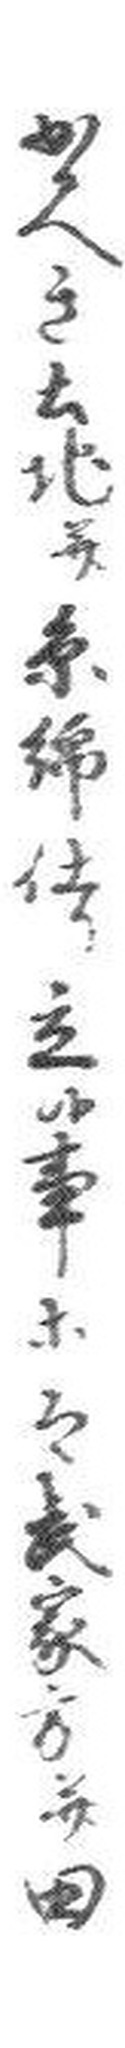かるへき土地并糸綿仕り立候事等は武家方并田
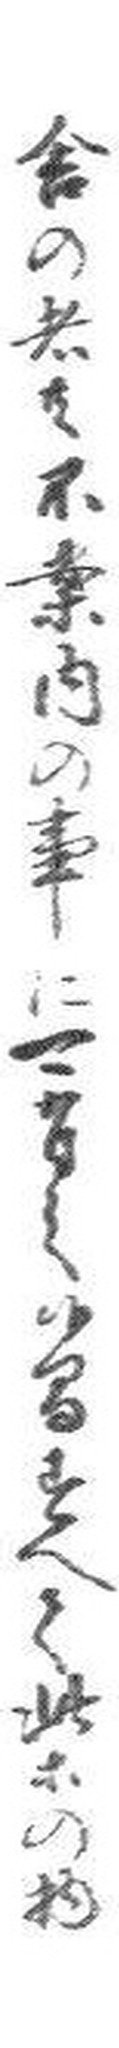舎の者共不案内の事に可有之候間すへて此等の物
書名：家譜 二十九 吉邦公 従正徳二年到正徳三年
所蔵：福井県文書館 Fukui Prefectural Archives
